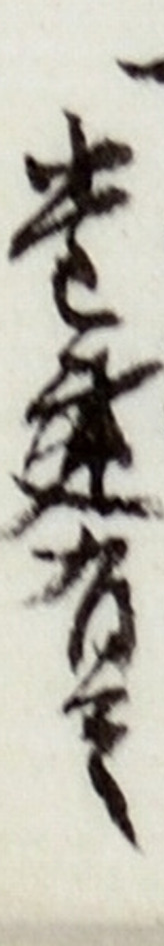宮建有之
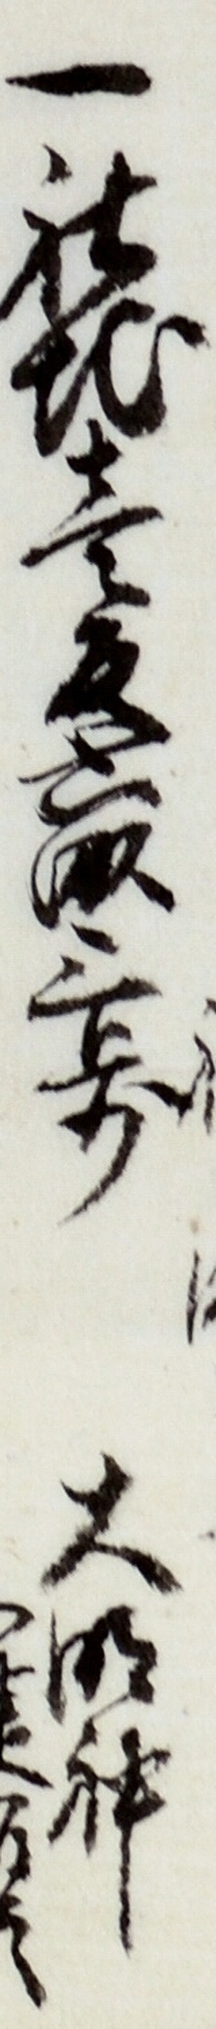一社地壱反六畝三歩大明神
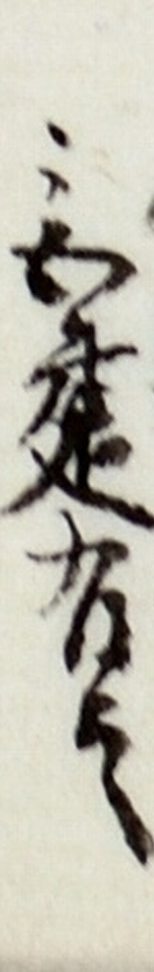宮建有之
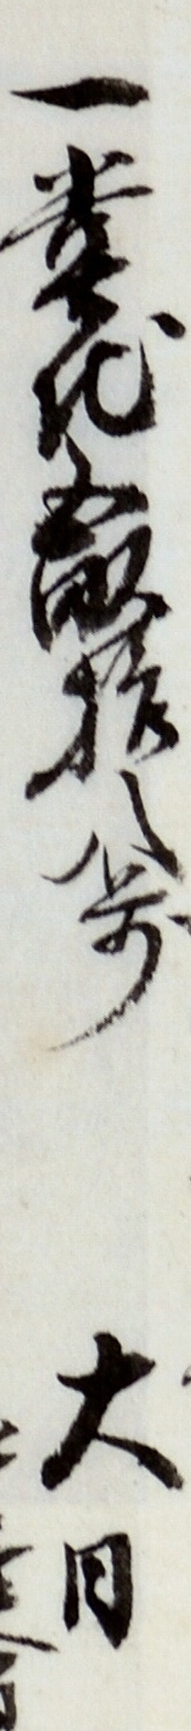一堂地五畝拾八歩大日
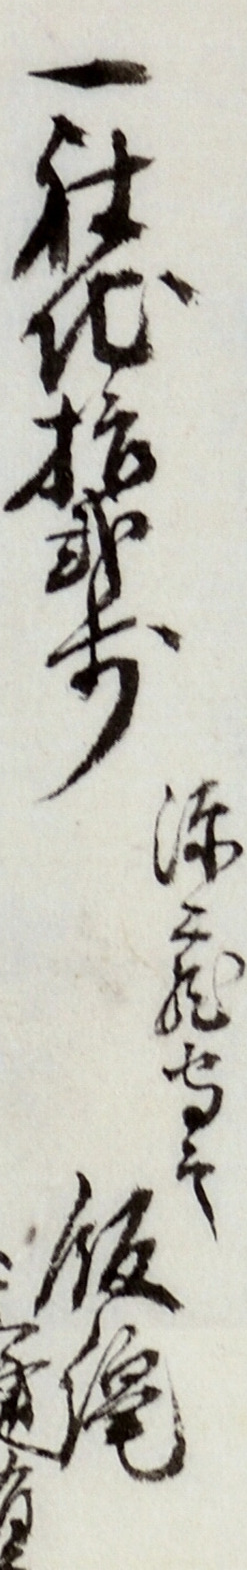一社地拾弐歩飯縄
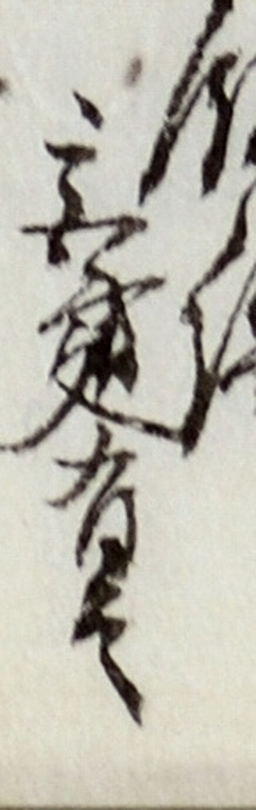宮建有之
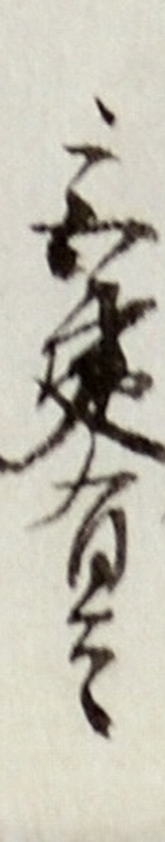宮建有之
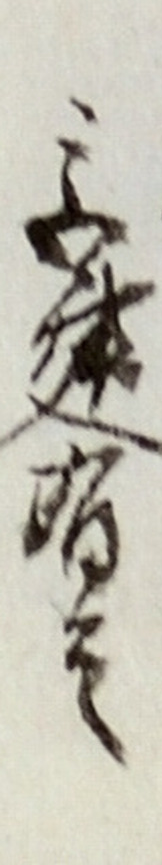宮建有之
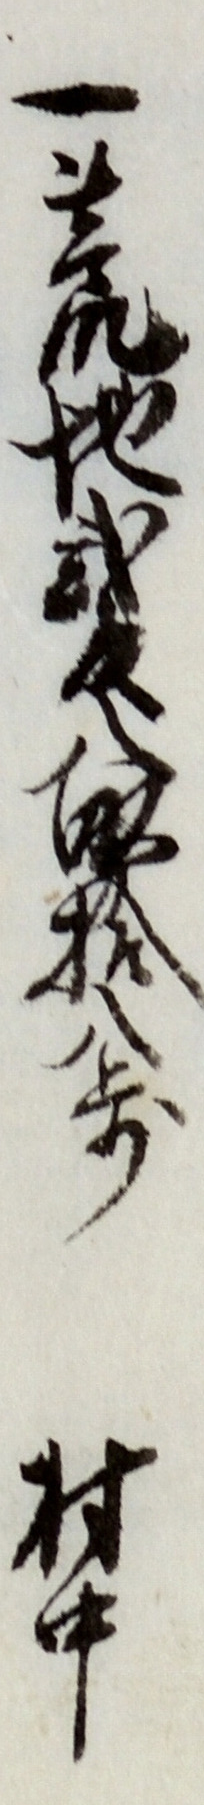一荒地弐反八畝拾八歩村中
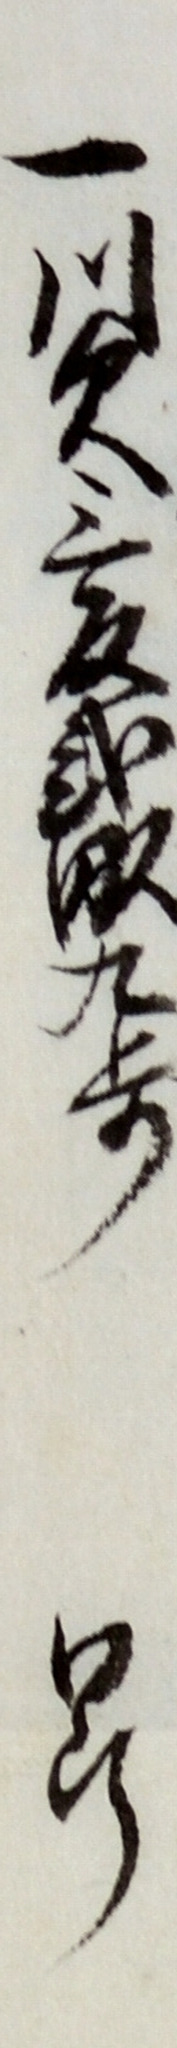一川欠三反弐畝九歩同断

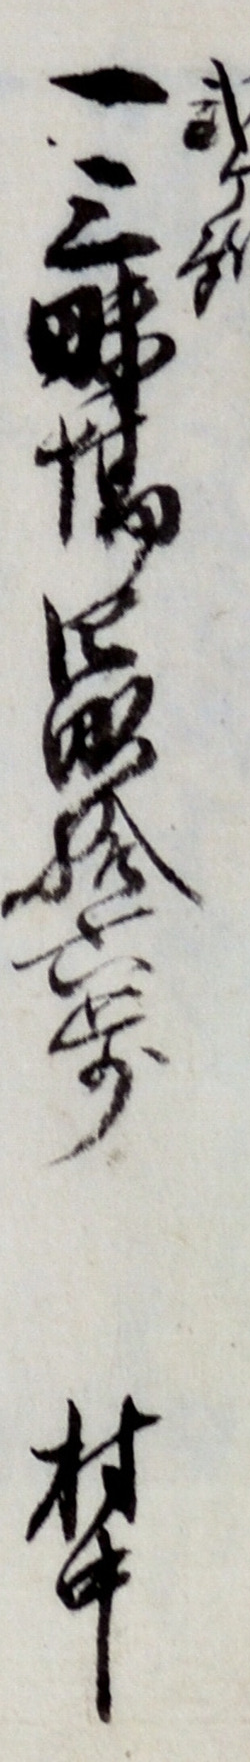一三昧場四畝拾六歩村中
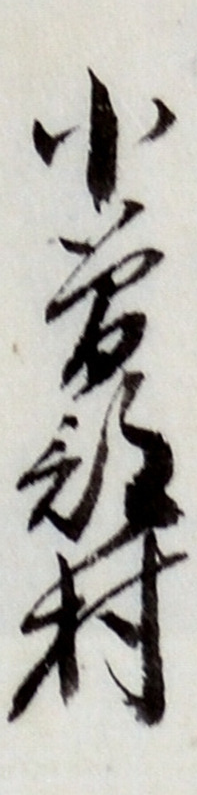小曾部村
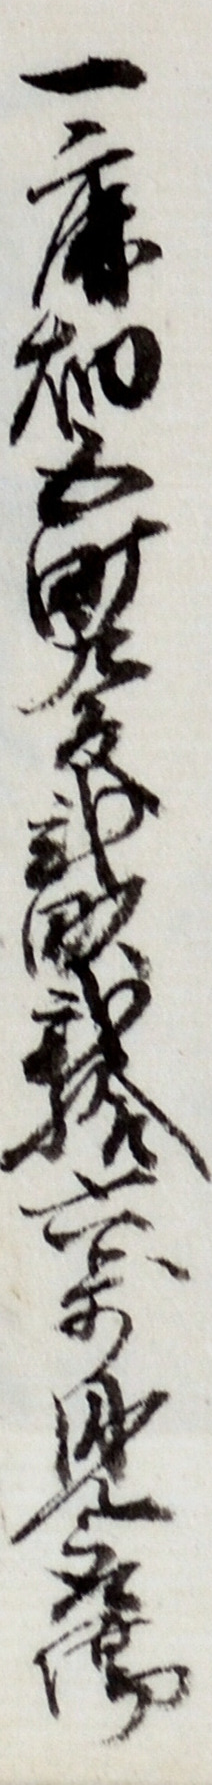一麻畑五町九反弐畝弐拾六歩見取場
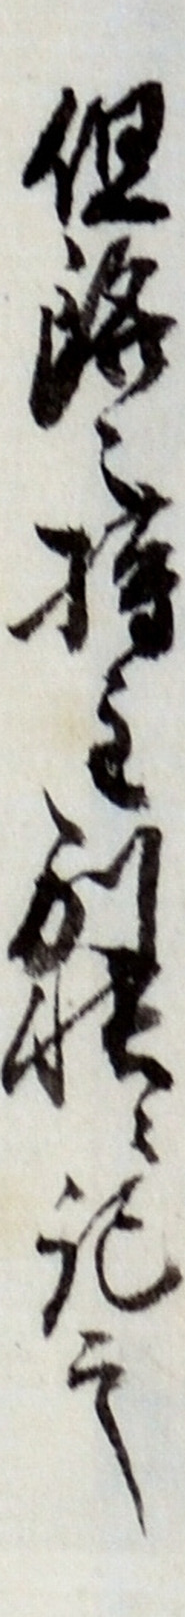但銘々持主別帳ニ記之
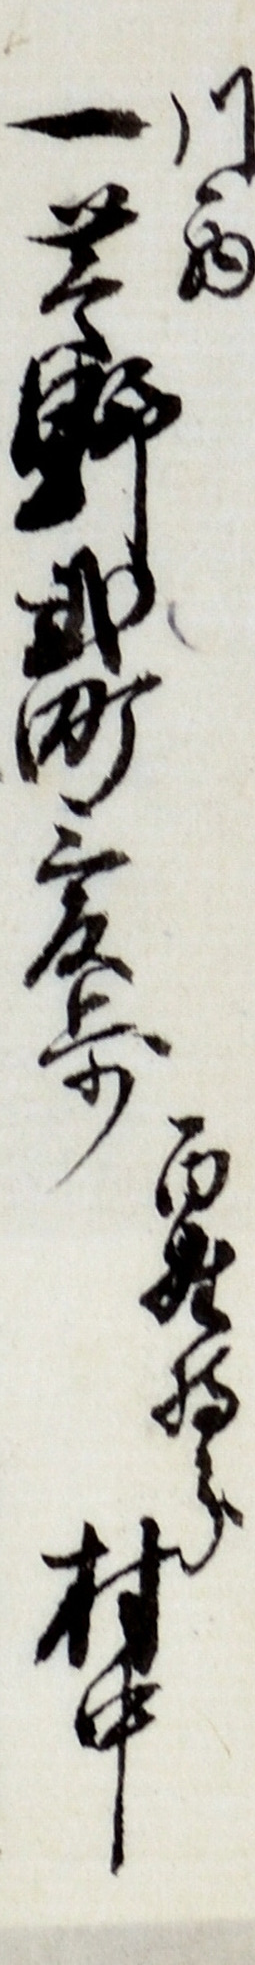一芝野弐町三反歩村中
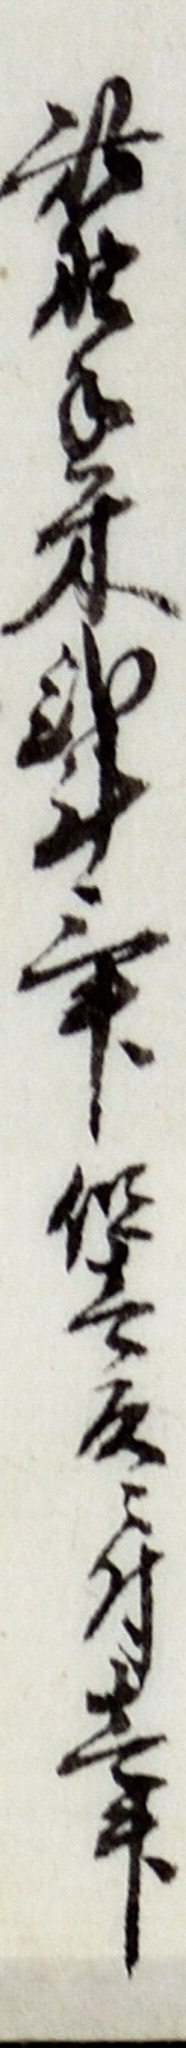此野手米弐斗三升但壱反ニ付壱升
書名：御領分中山林社地手控
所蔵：伊那市立高遠町図書館・合同会社AMANE
